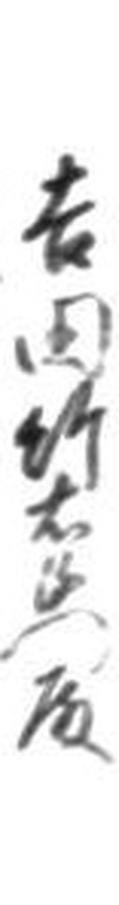吉田竹右衛門殿
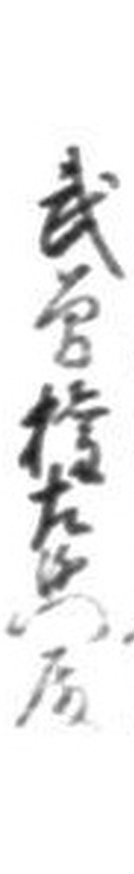武曽権左衛門殿
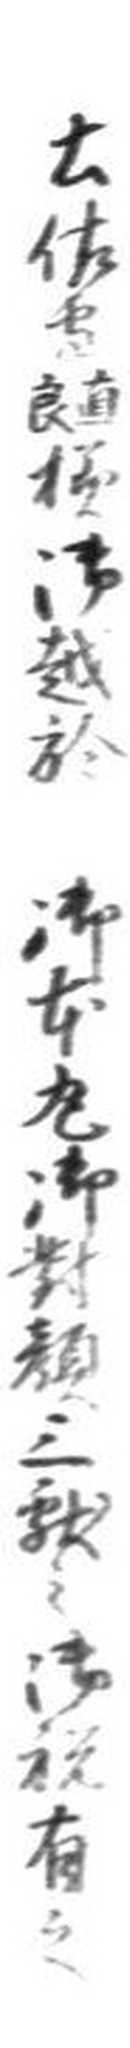土佐守直良様御越於御本丸御對顔三献之御祝有之
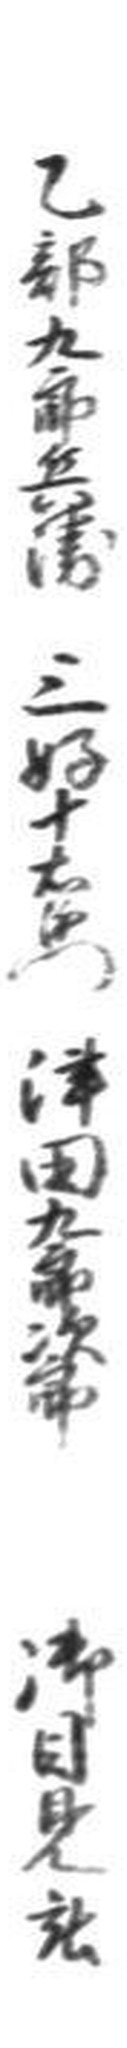乙部九郎兵衛三好十右衛門津田九郎次郎御目見被
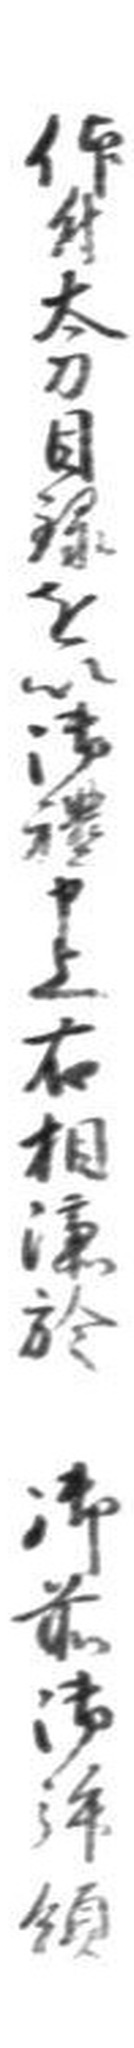仰付太刀目録を以御礼申上右相済於御前御拝領

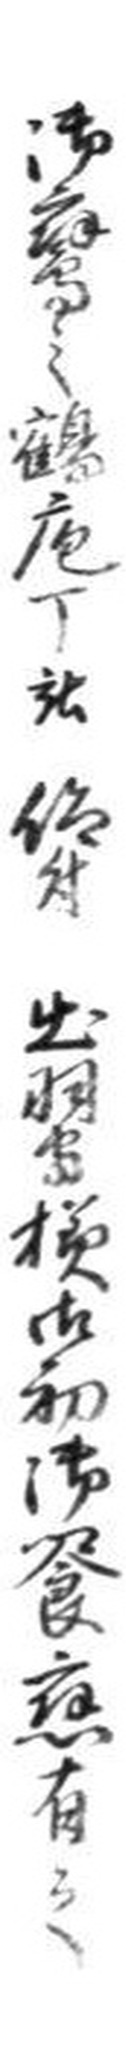御鷹之鶴庖丁被仰付出羽守様御初御餐應有之
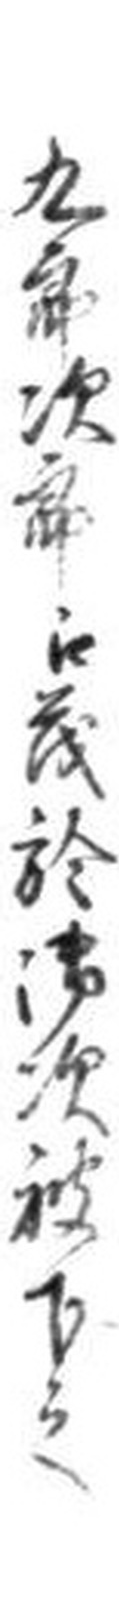九郎次郎江も於御次被下之
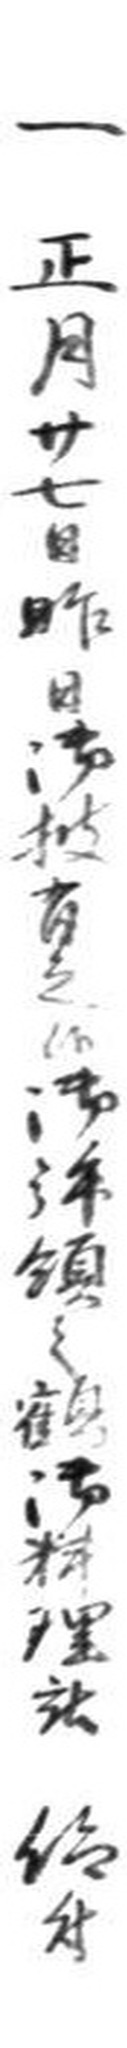一正月廿七日昨日御披有之候御拝領之鶴御料理被仰付
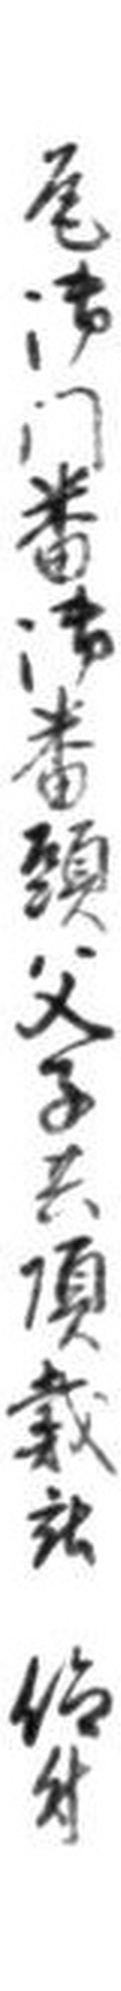瓦御門番御番頭父子共頂戴被仰付
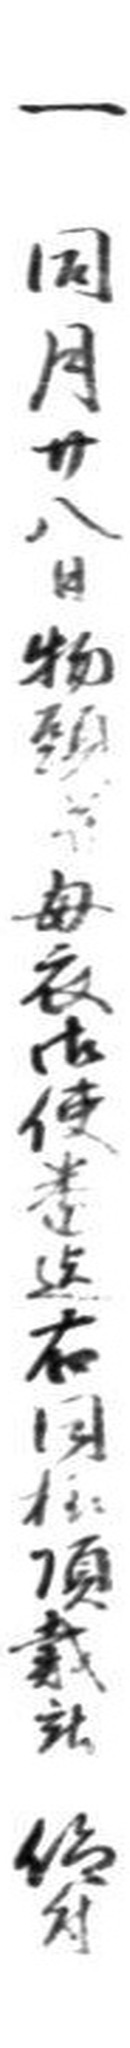一同月廿八日物頭并母衣御使番迄右同様頂戴被仰付
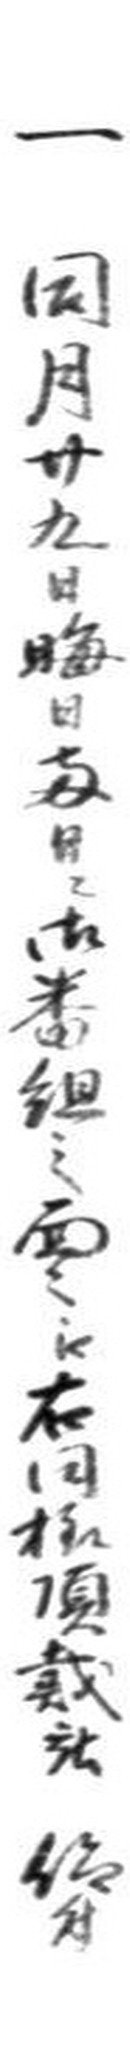一同月廿九日晦日両日ニ御番組之面々江右同様頂戴被仰付
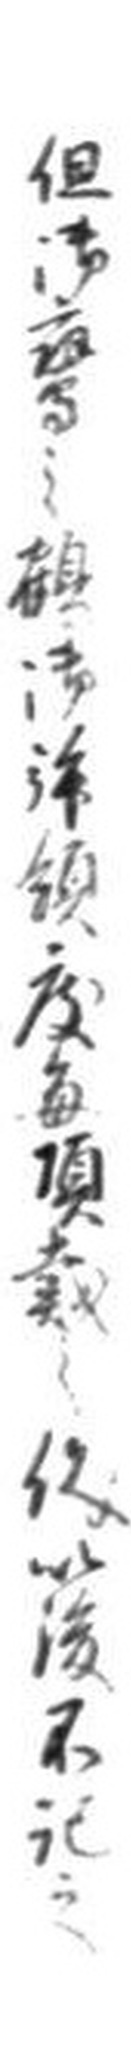但御鷹之鶴御拝領度毎頂戴之儀以後不記之
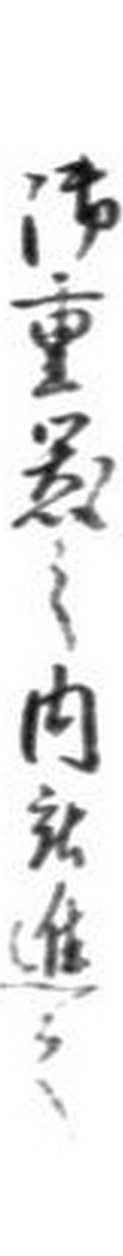御重器之内被進之
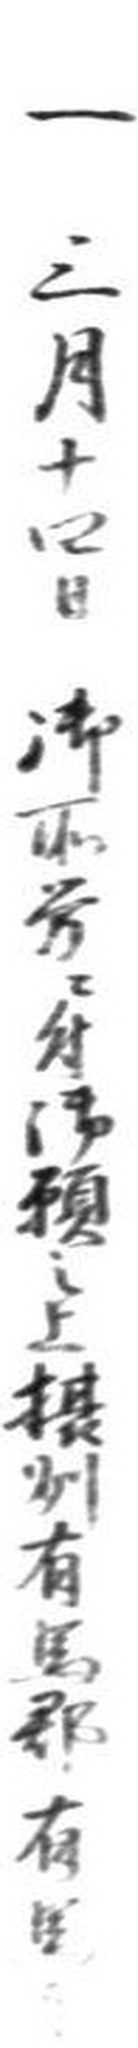一三月十四日御所労ニ付御願之上摂州有馬郡有馬

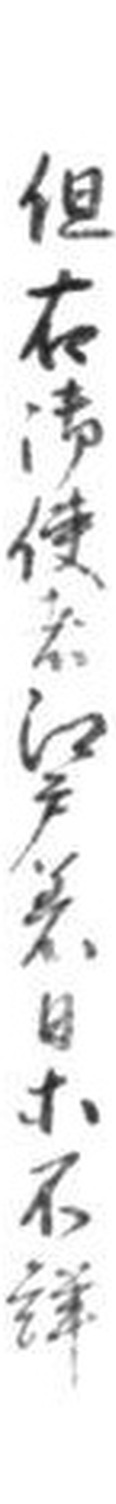但右御使者江戸着日等不詳
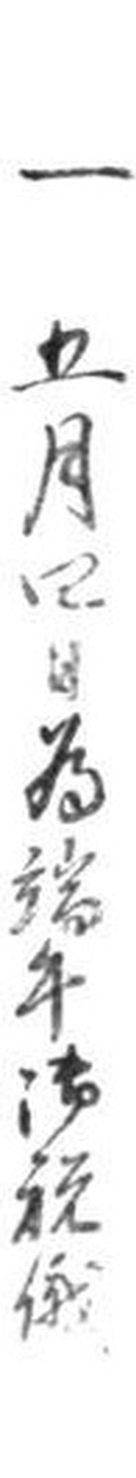一五月四日為端午御祝儀
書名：家譜 三 忠昌公 従慶長八年到寛永六年
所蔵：福井県文書館 Fukui Prefectural Archives
